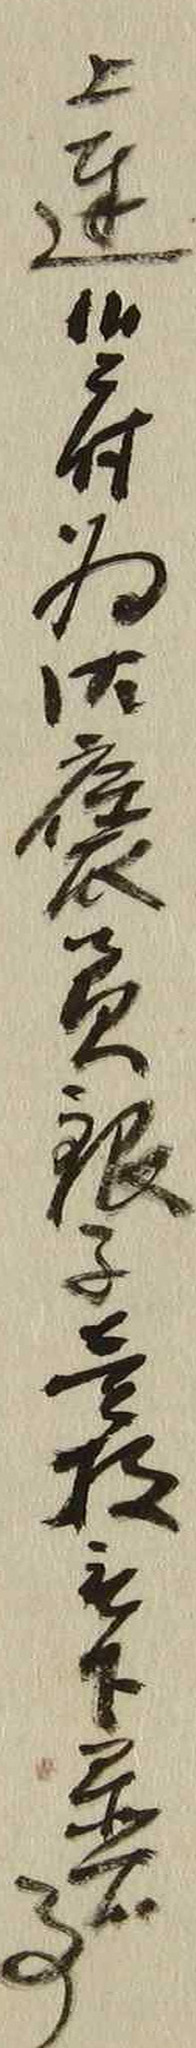上達候に付為御褒美銀子壱枚被下置候事
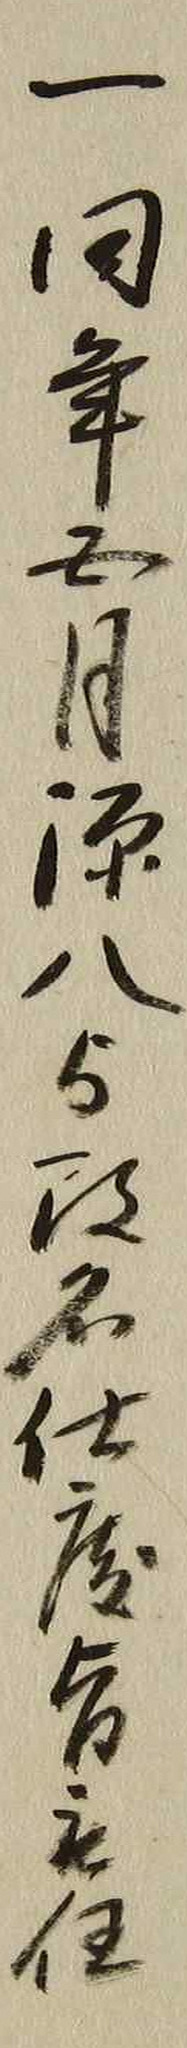一同年五月源八と改名仕度旨被任
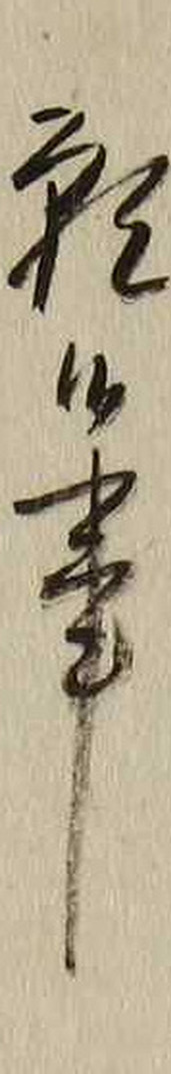願候事
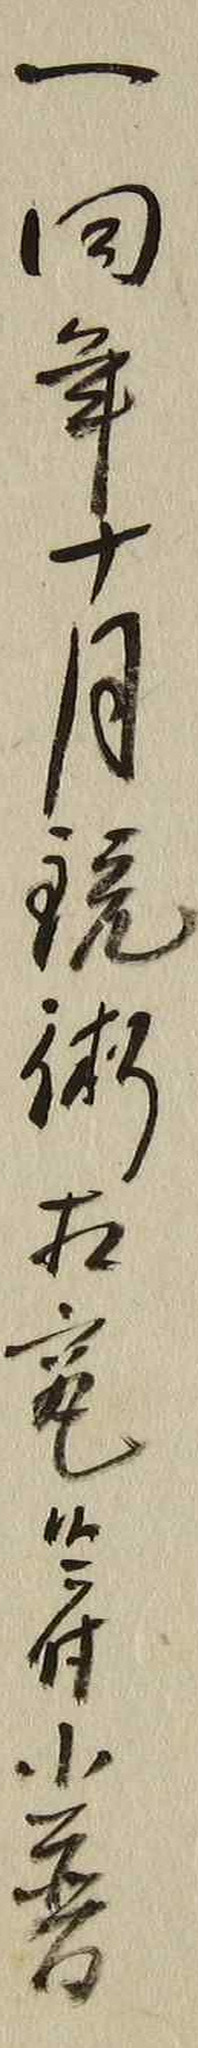一同年十月銃術相究候に付小普
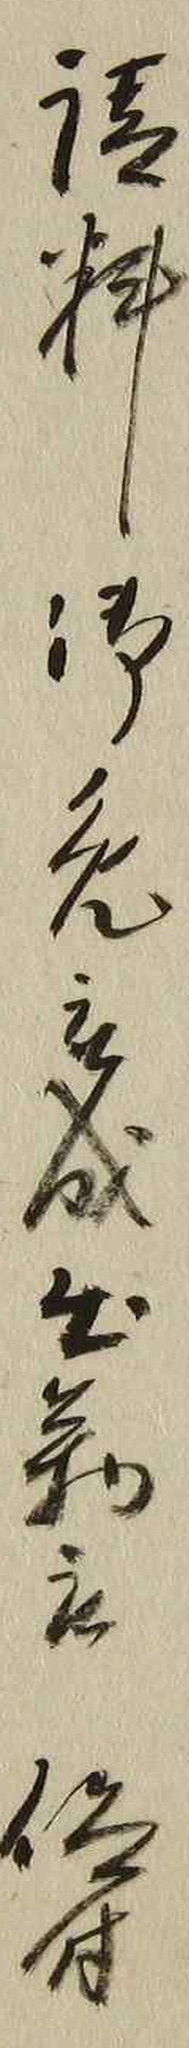請料御免被成出勤被仰付
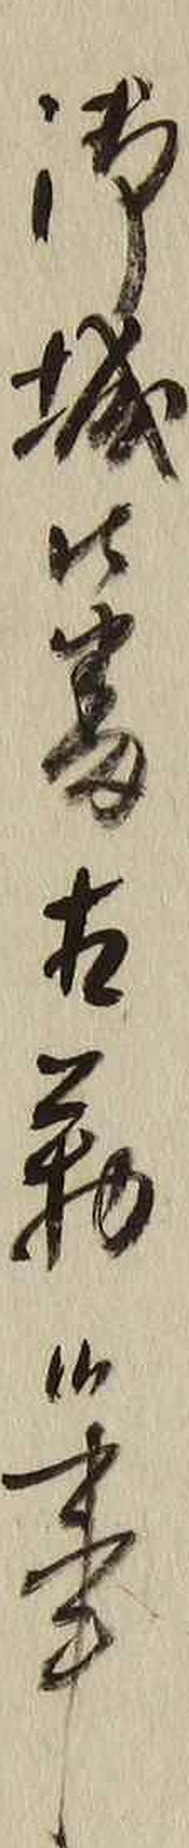御城御番相勤候事
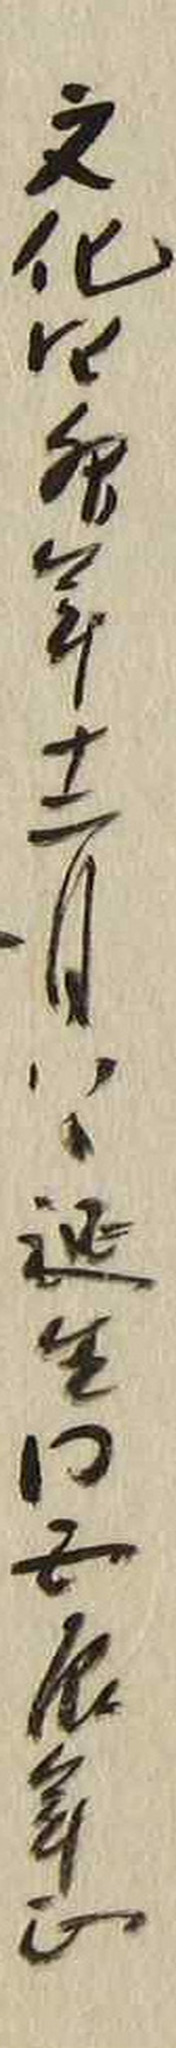忠三郎文化四卯年十二月八被誕生同五辰年正
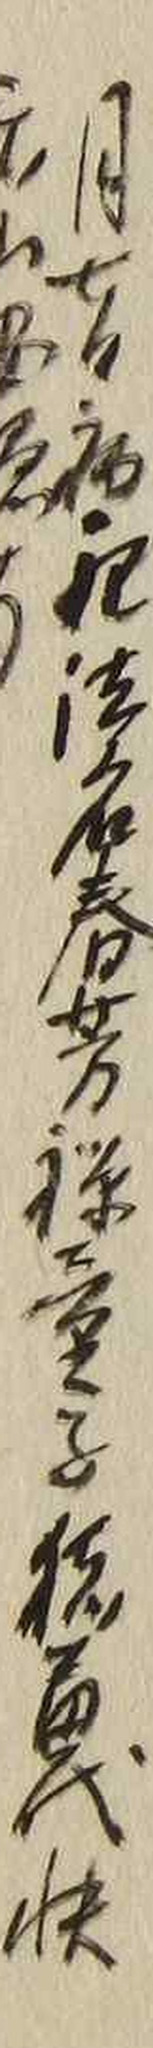月七被病死法名春芳禅童子猪苗代快
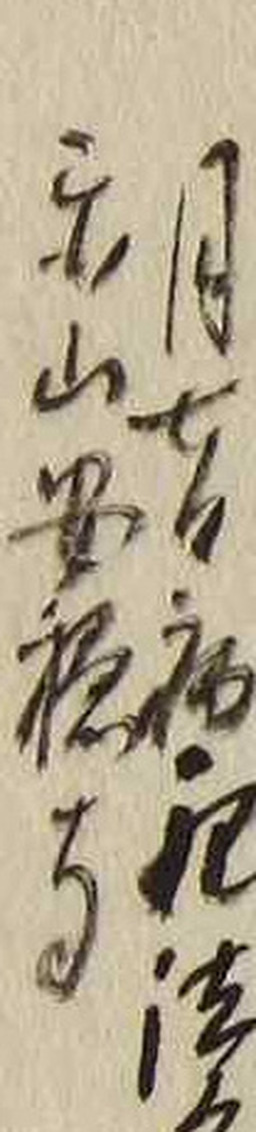示山安穏寺
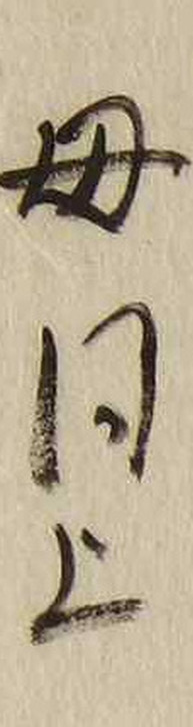母同上

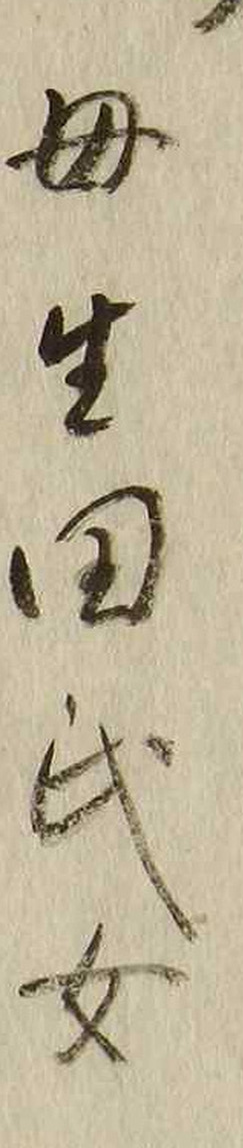母生田氏女

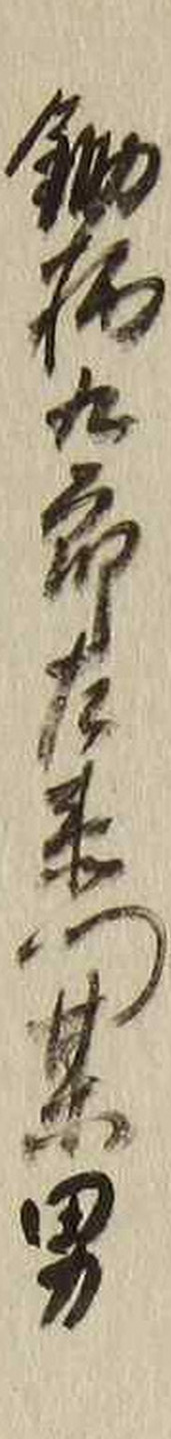鋤柄九郎左衛門某男
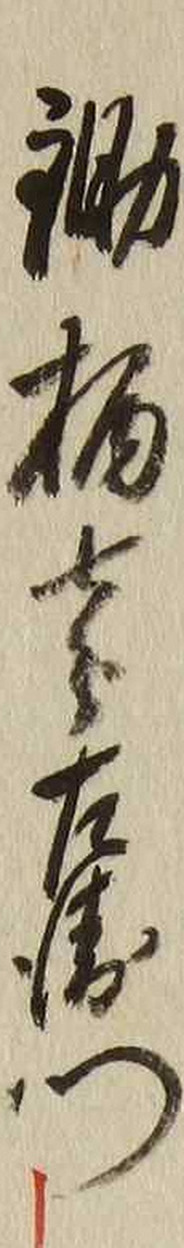鋤柄七郎左衛門
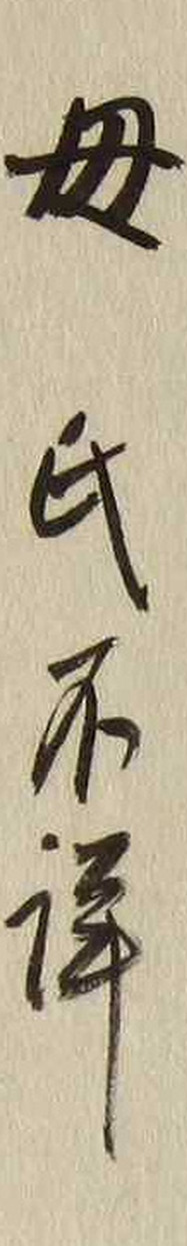母氏不詳
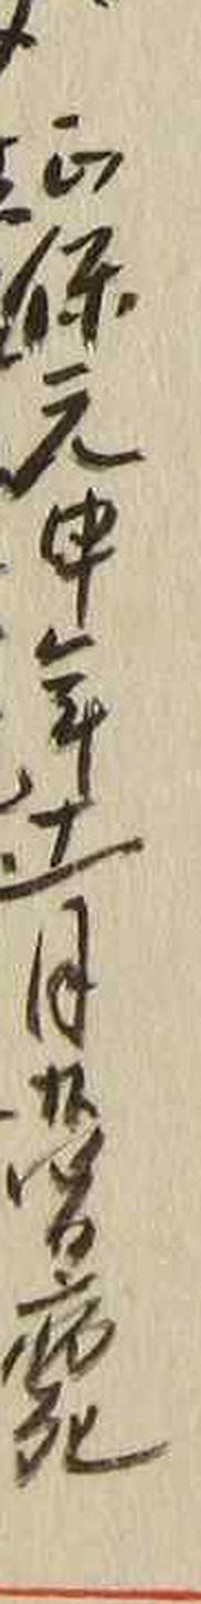正保元申年十一月廿四日病死
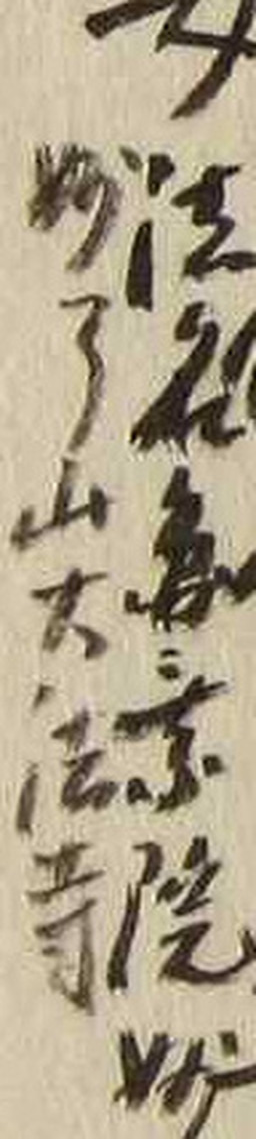妙了山大法寺
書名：諸士系譜　巻之360　す之部10
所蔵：会津若松市立会津図書館
